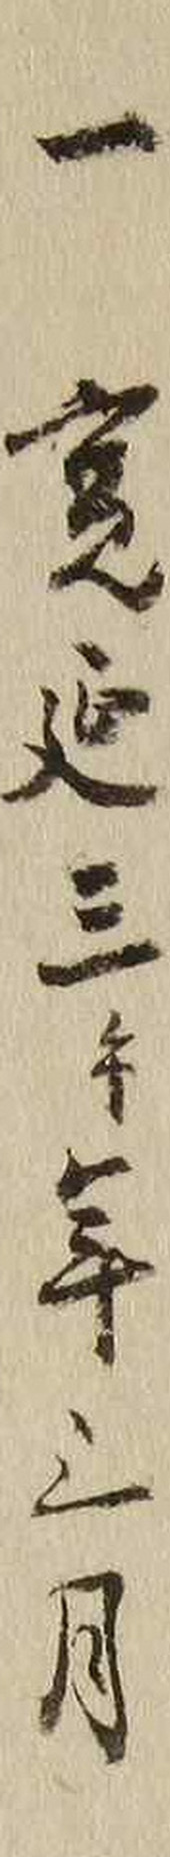一寛延三午年三月
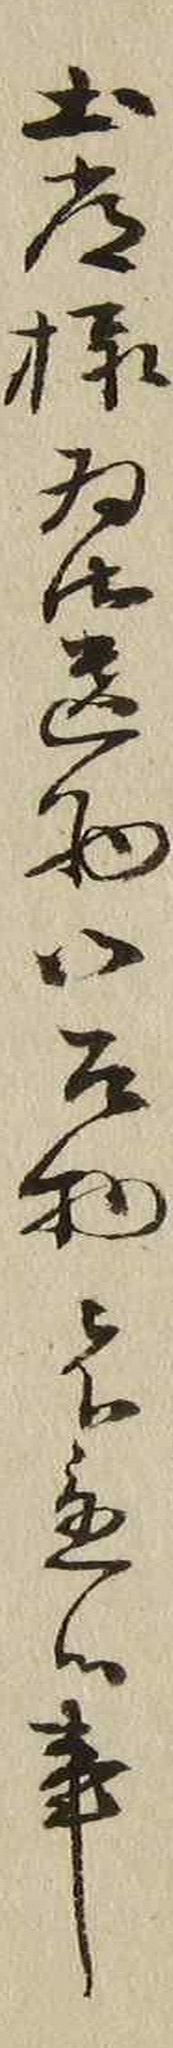土常様為御遺物御召物被下置候事
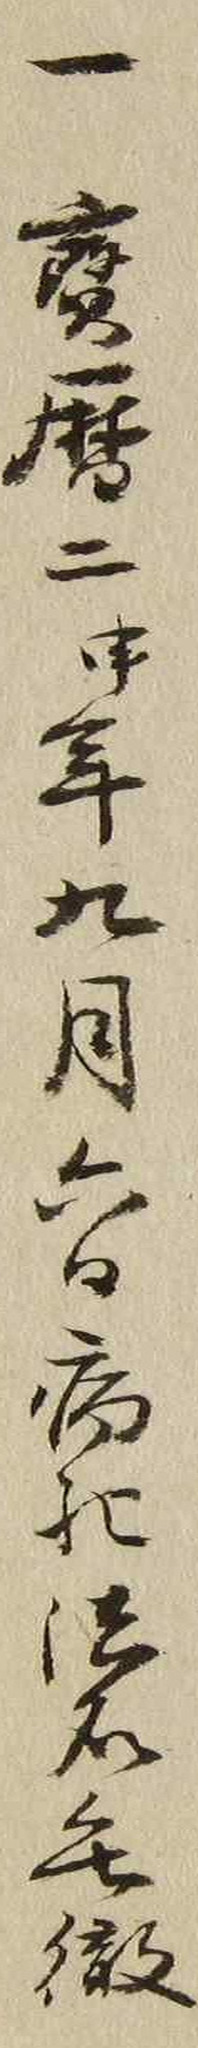一宝暦二申年九月六日病死法名無徹
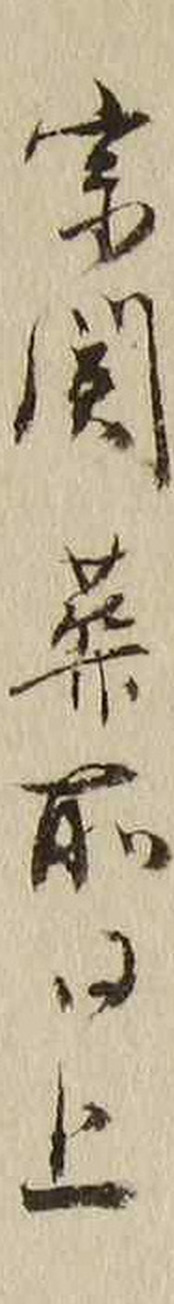宗関葬所同上

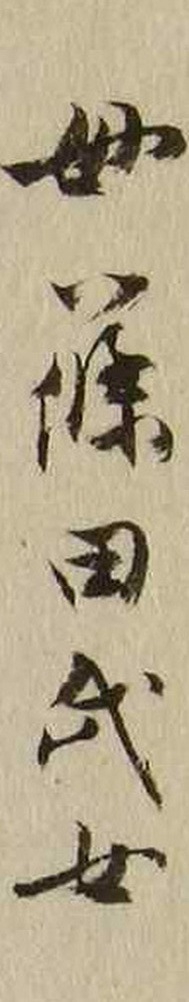母篠田氏女
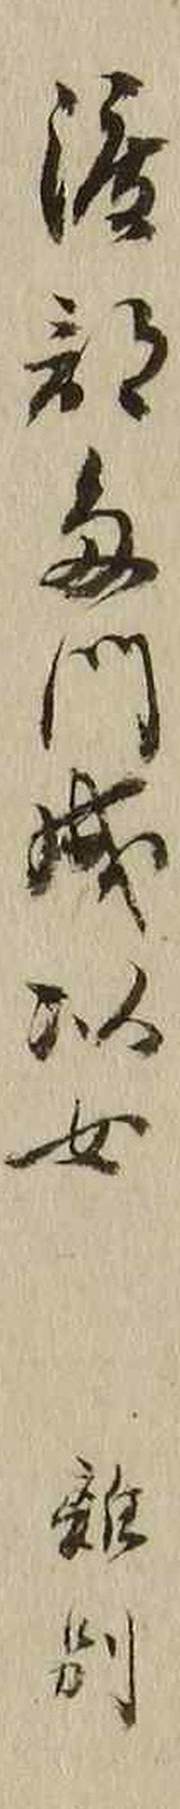渡部多門成以女離別
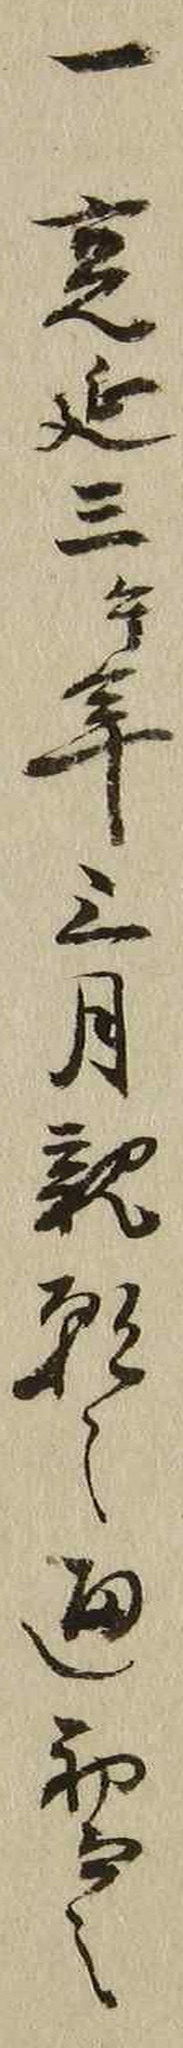一寛延三午年三月親願之通初而之
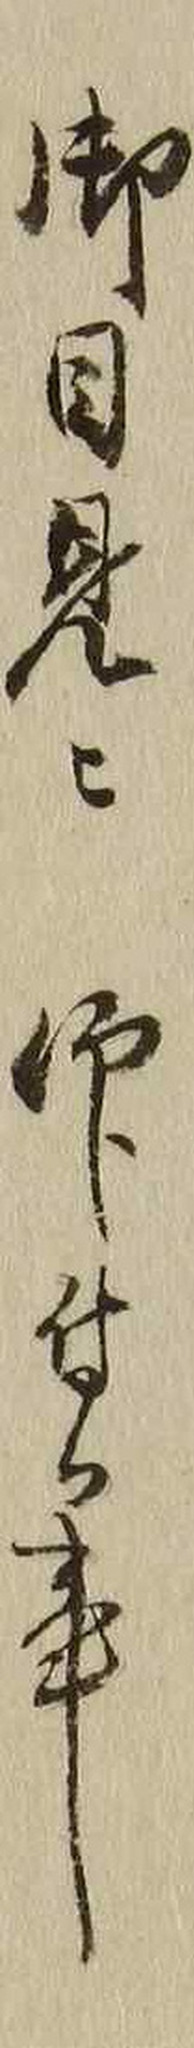御目見被仰付候事
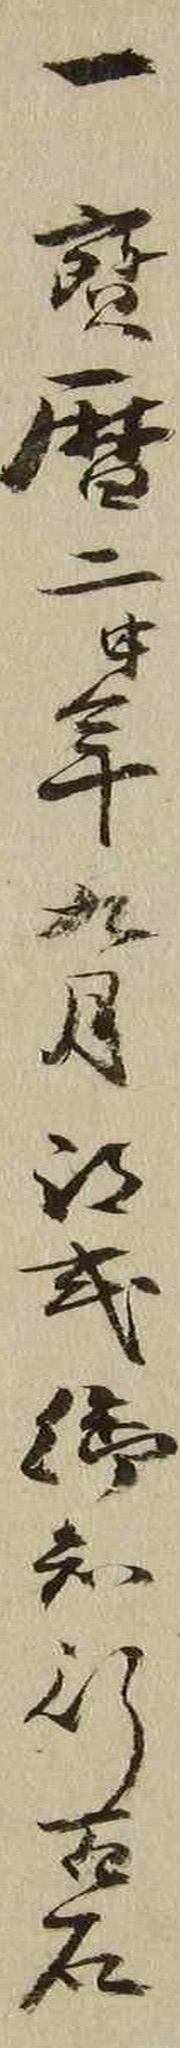一宝暦二申年九月跡式御知行百石
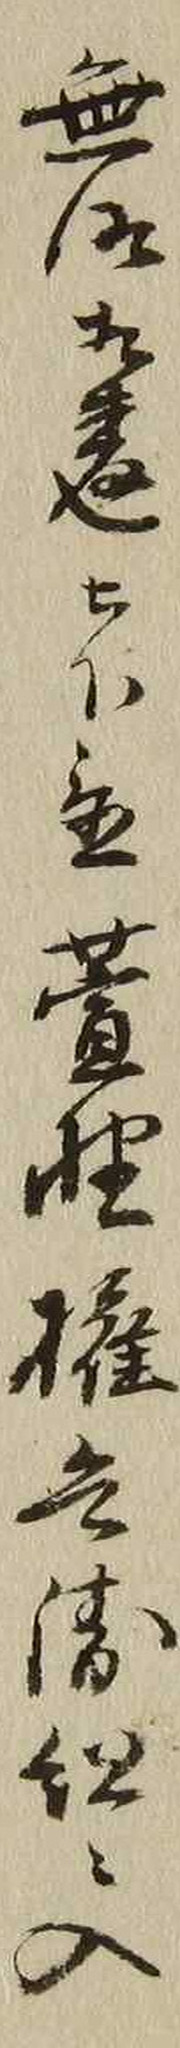無御相違被下置萱野権兵衛組ニ入
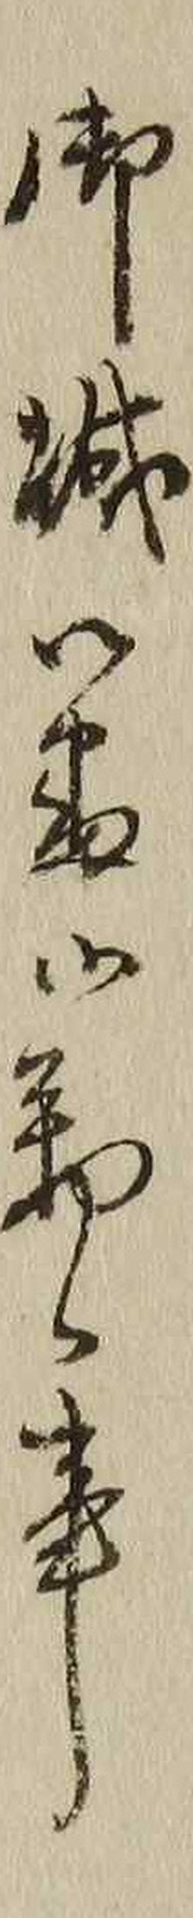御城御番御勤候事
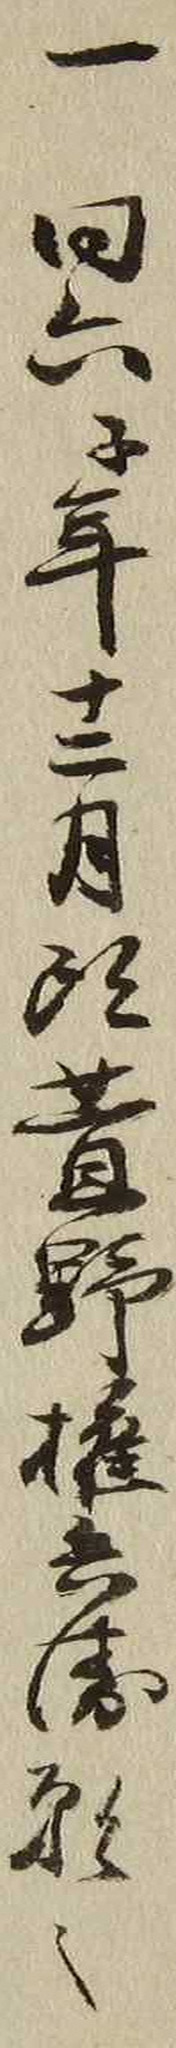一同六子年十二月頭萱野権兵衛願之
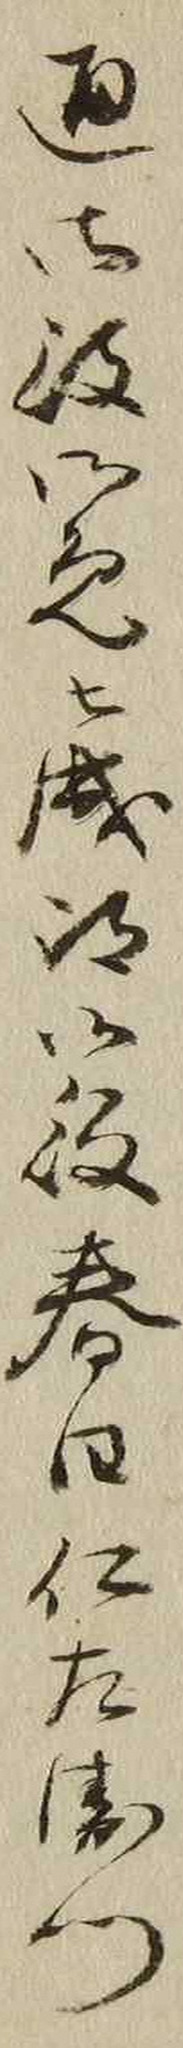通御役御免被成跡御役春日仁左衛門
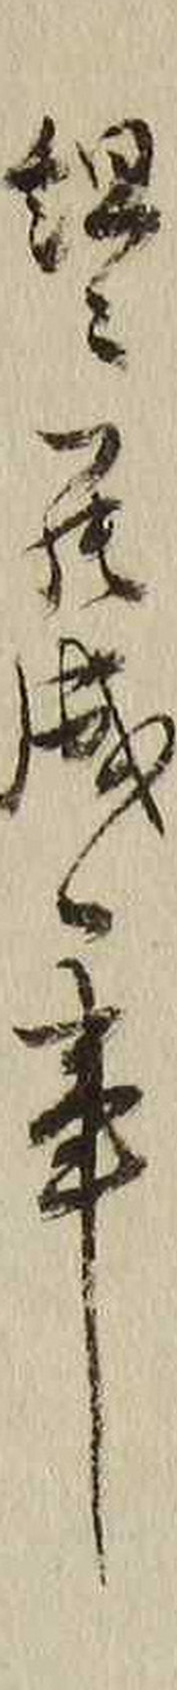組ニ罷成候事
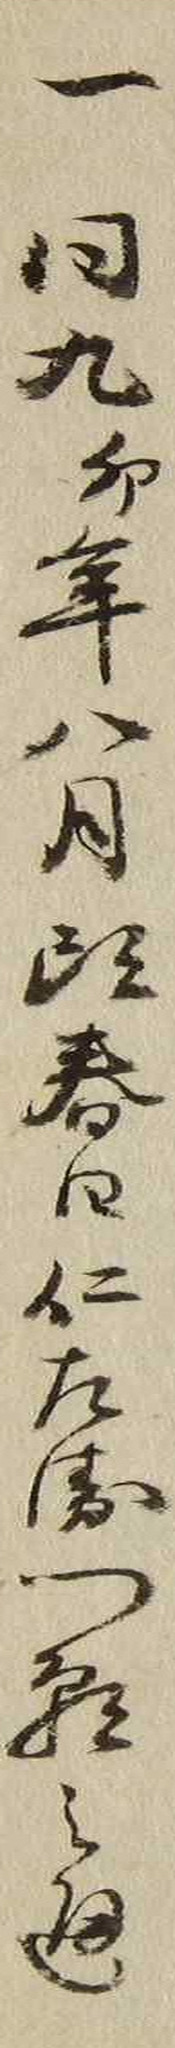一同九卯年八月頭春日仁左衛門願之通
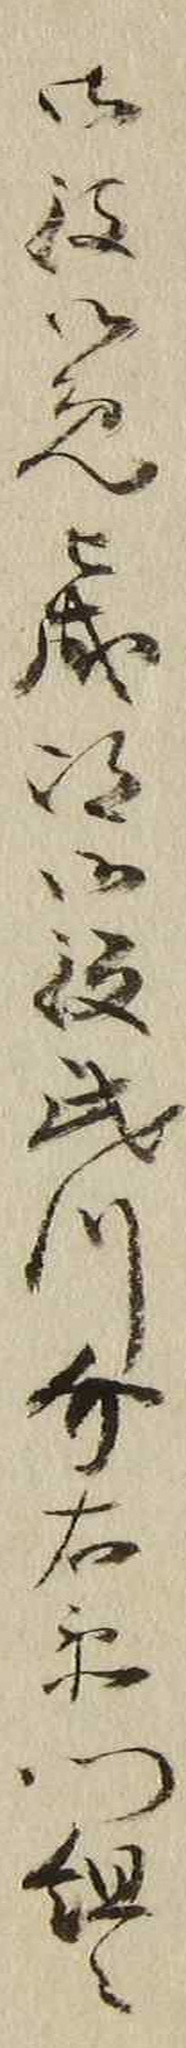御役御免被成跡御役氏川介右衛門組ニ
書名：諸士系譜　巻之232　け之部1
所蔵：会津若松市立会津図書館
